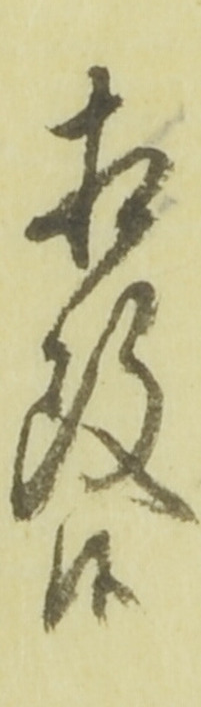相改候
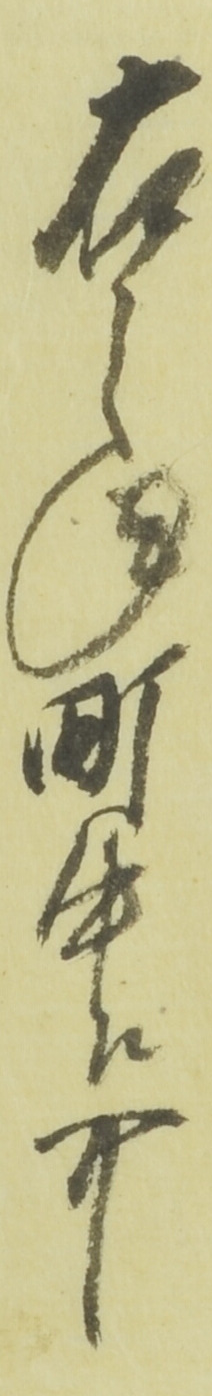右之趣町中江可
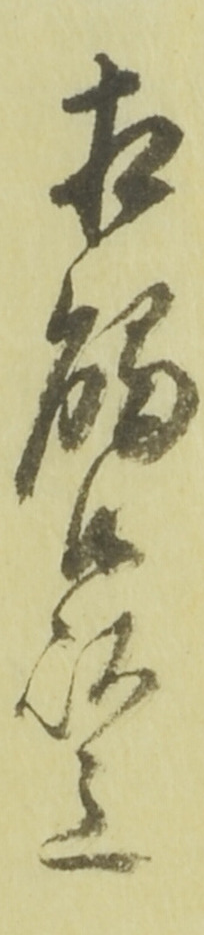相触候以上
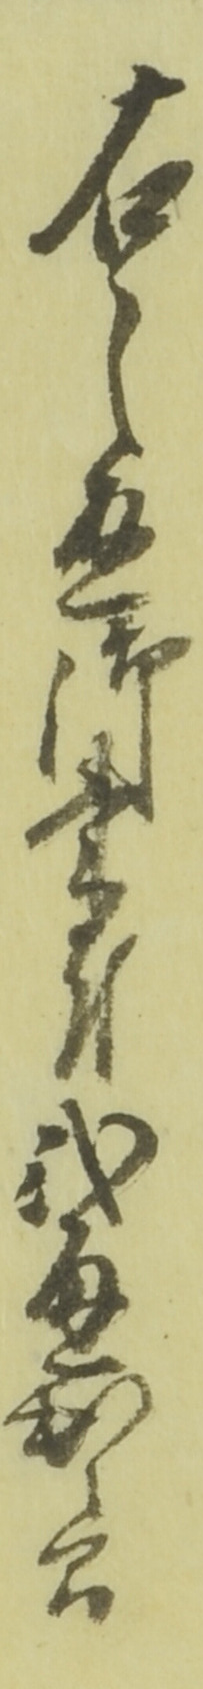右之通御書付弐通出候間
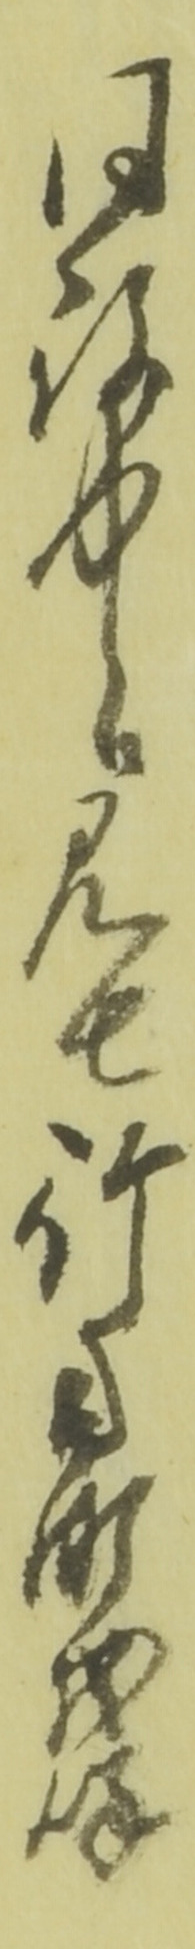同役中江見せ行司町を呼
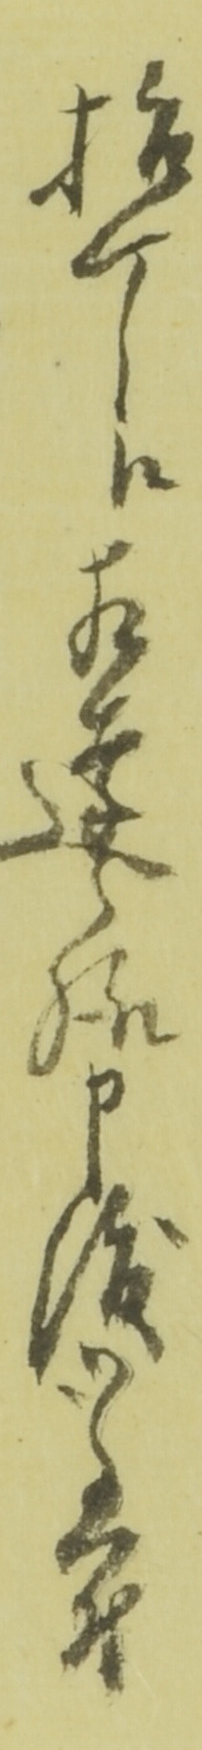拾丁江相達候様申渡御書付
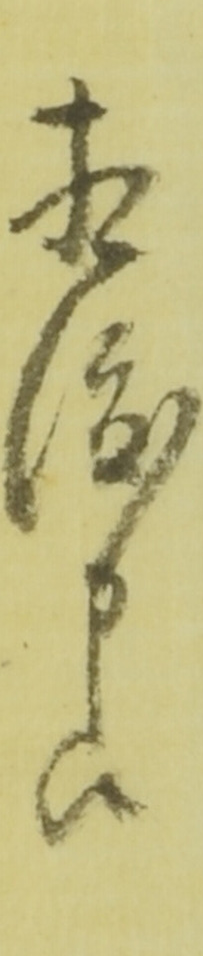相渡申候
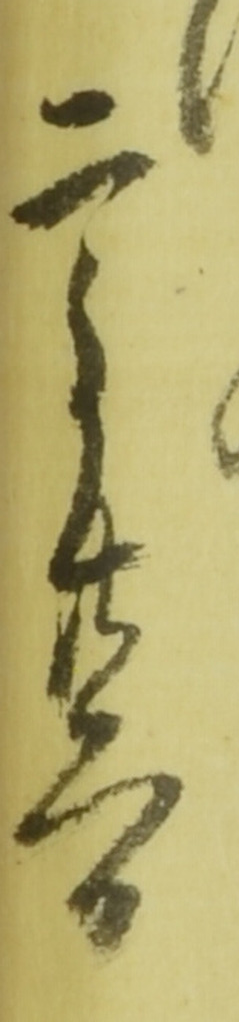二月廿二日
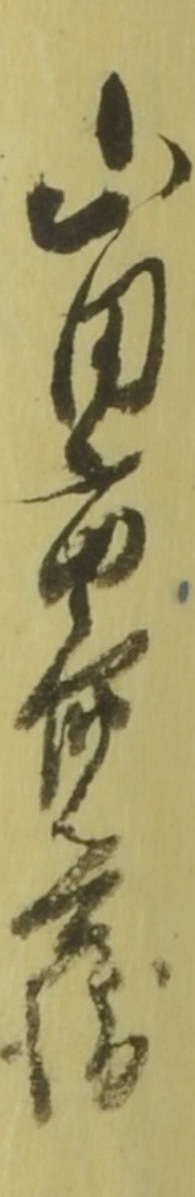山田市郎兵衛
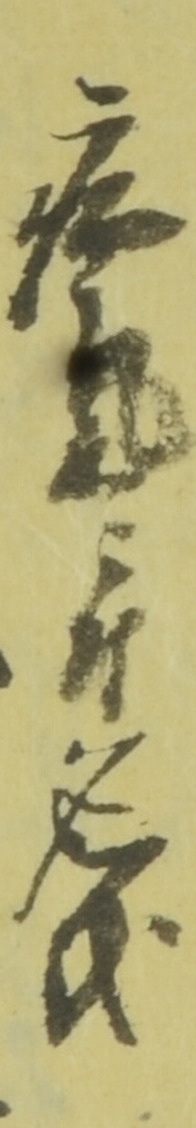病気ニ付名代
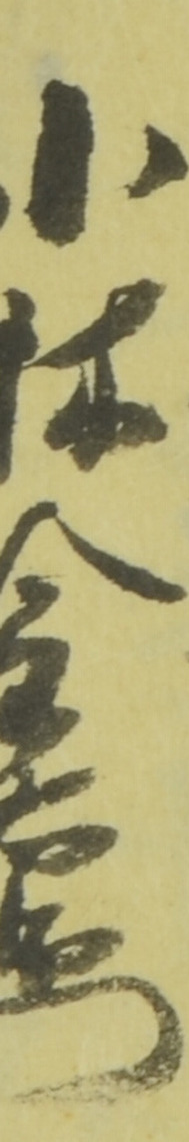小林金右衛門

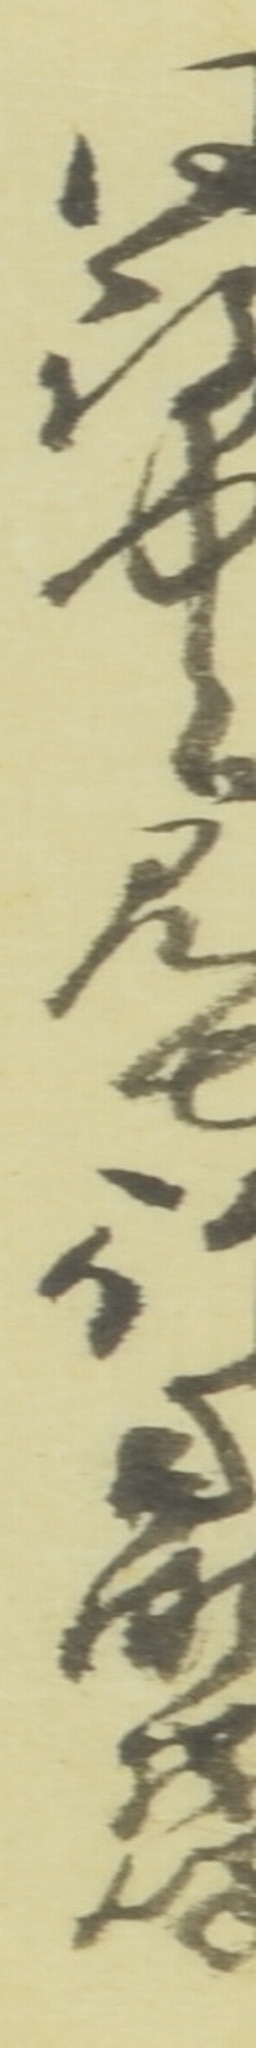同役中江見せ行司町を呼
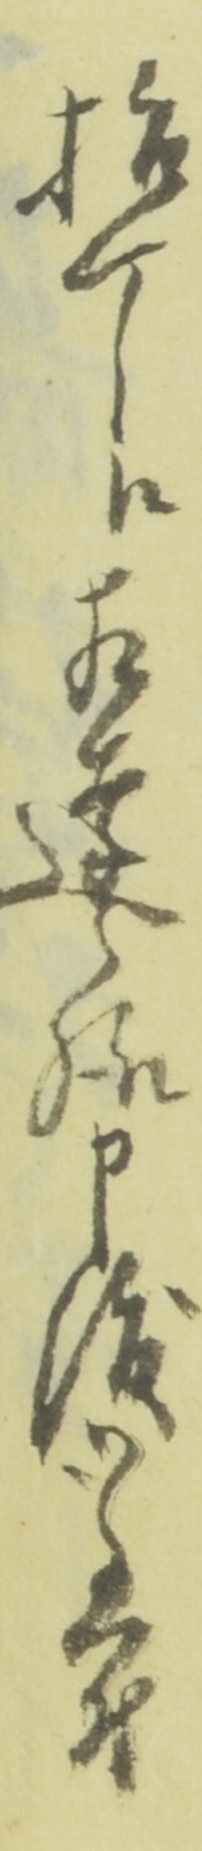拾丁江相達候様申渡御書付
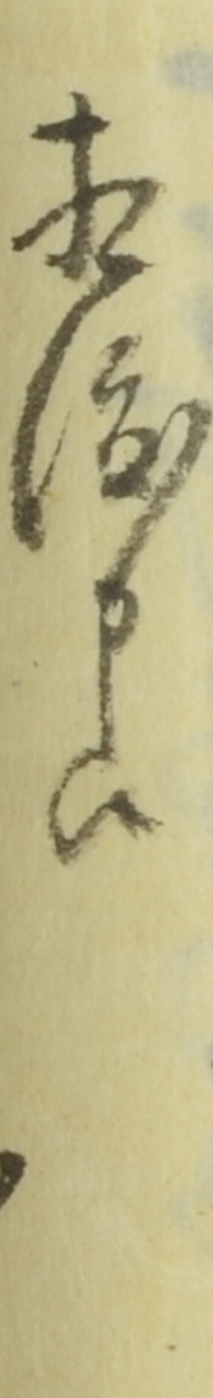相渡申候
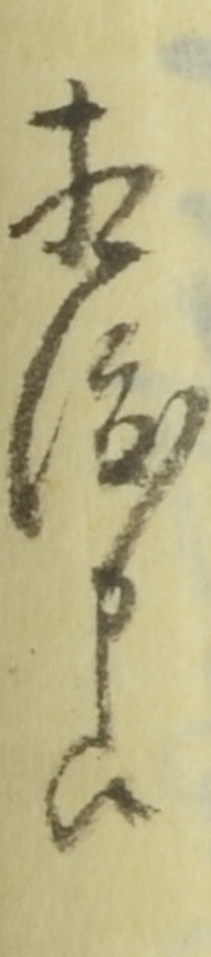相渡申候
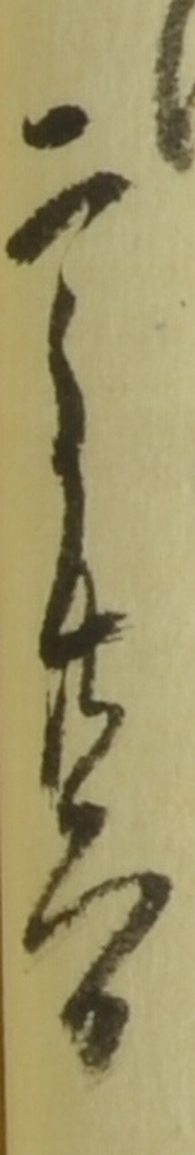二月廿二日
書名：御触書御書附控
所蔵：伊那市立高遠町図書館・合同会社AMANE
